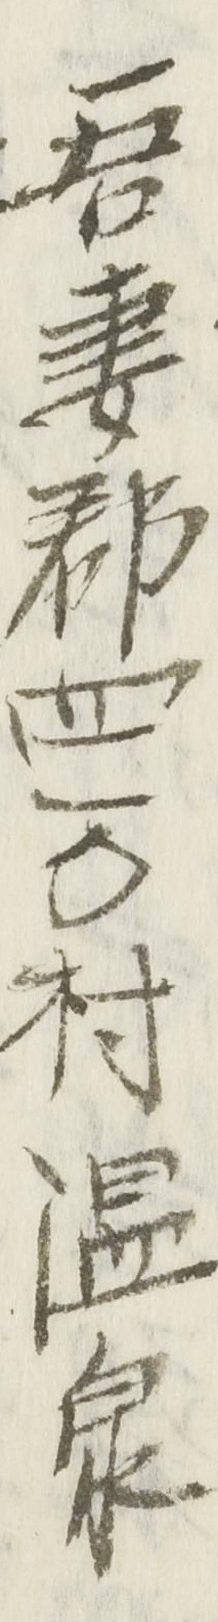吾妻郡四万村温泉
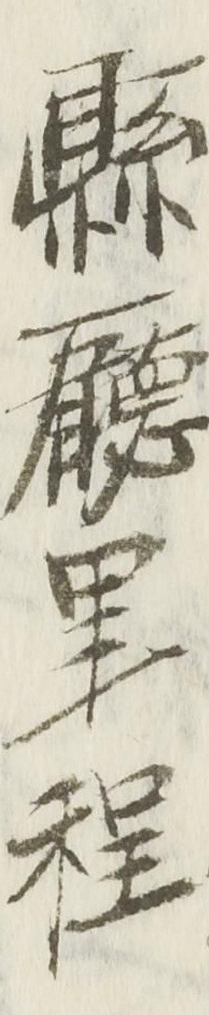県庁里程
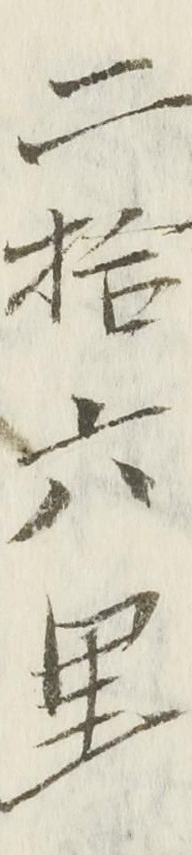二拾六里
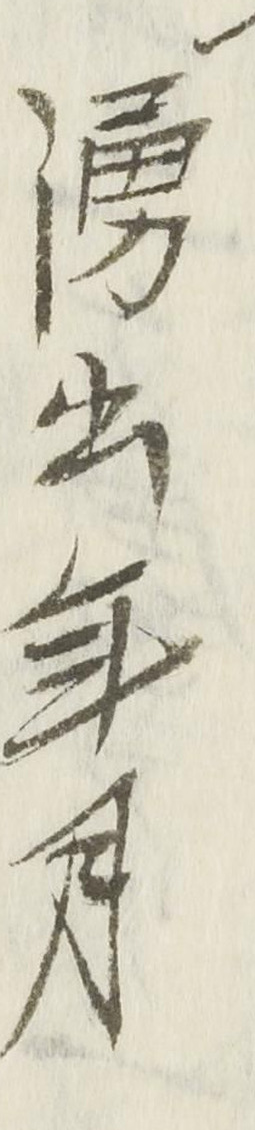湧出年月
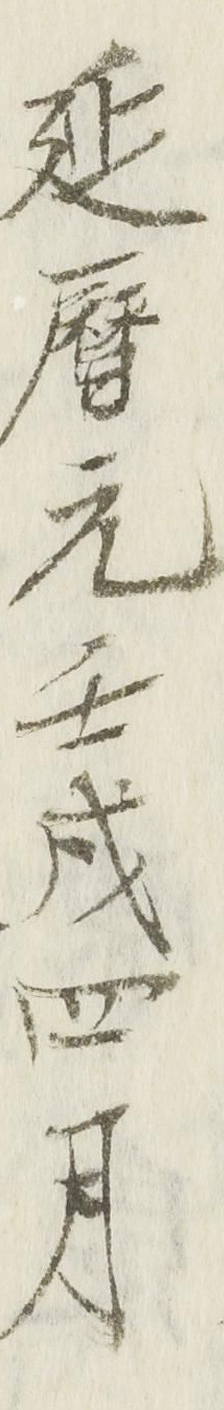延暦元壬戌四月
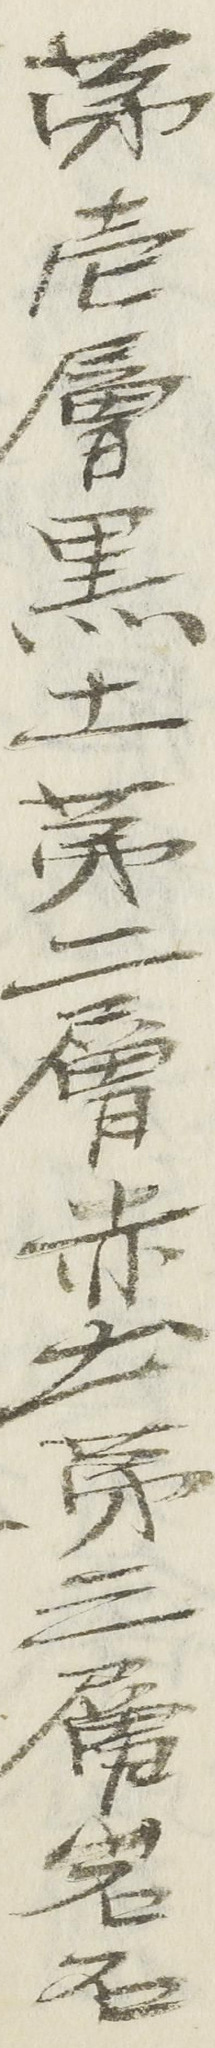第壱層黒土第二層赤土第三層岩石
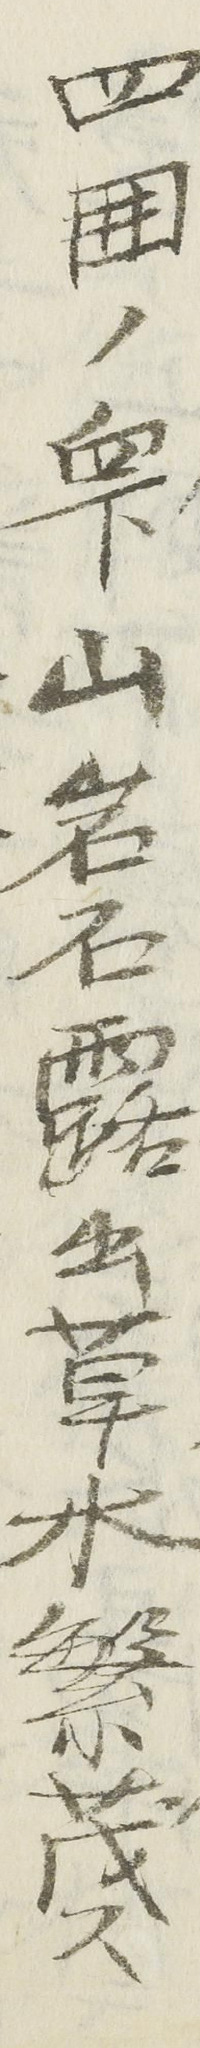四囲ノ衆？山岩石露出草木繁茂ス
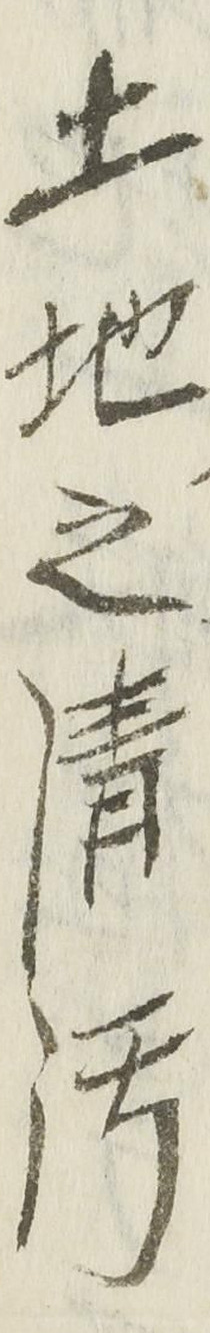土地ノ清汚

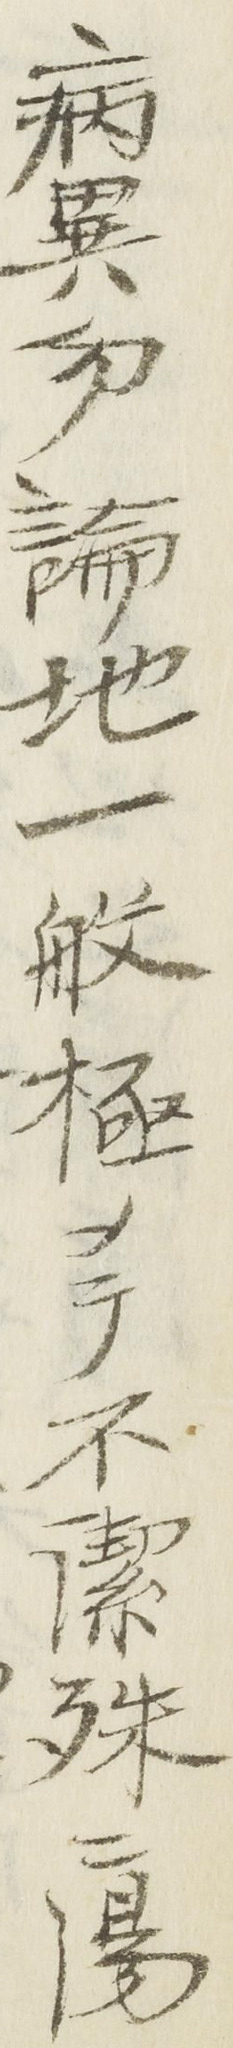病異勿論地一般極メテ不潔殊ニ湯
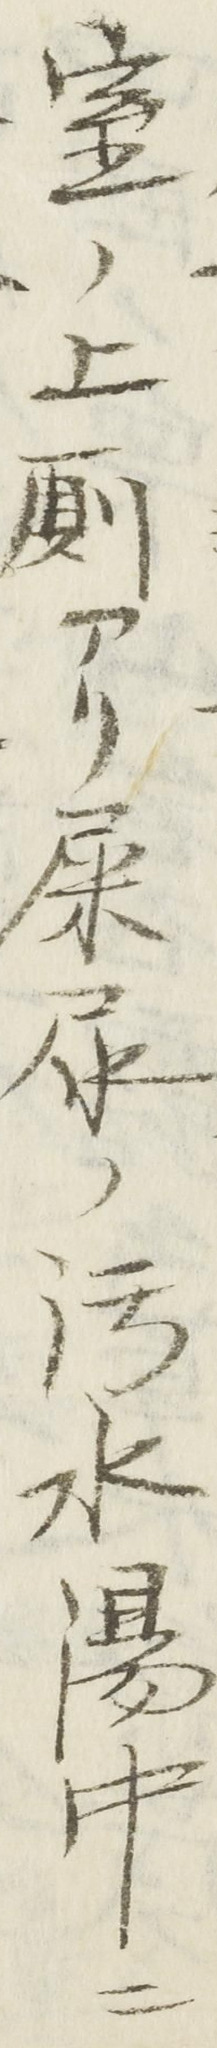室ノ上厠アリ屎尿ノ汚水湯中ニ
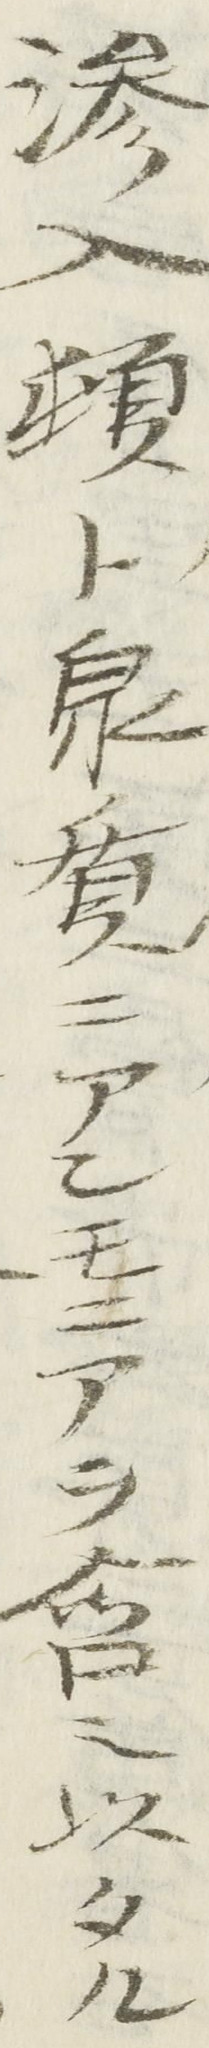滲入頻ト泉質ニアンモニアヲ含也以タル
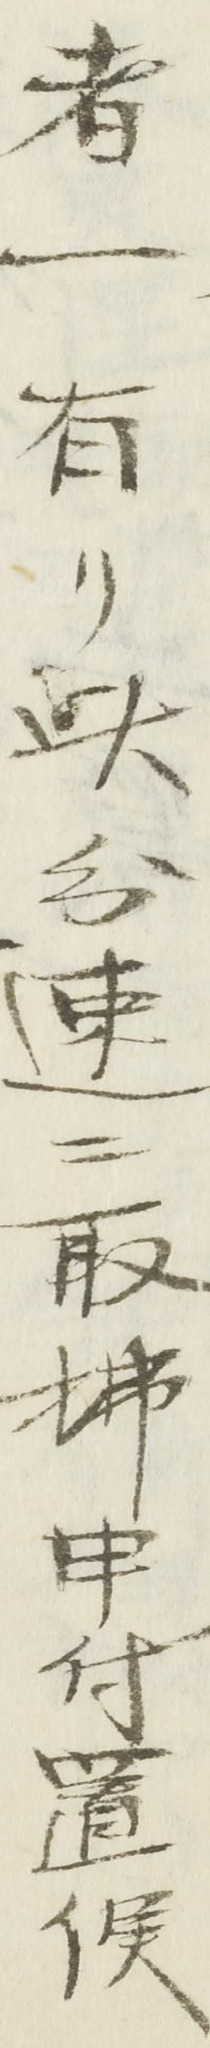者一有リ此分速ニ取払申付置候
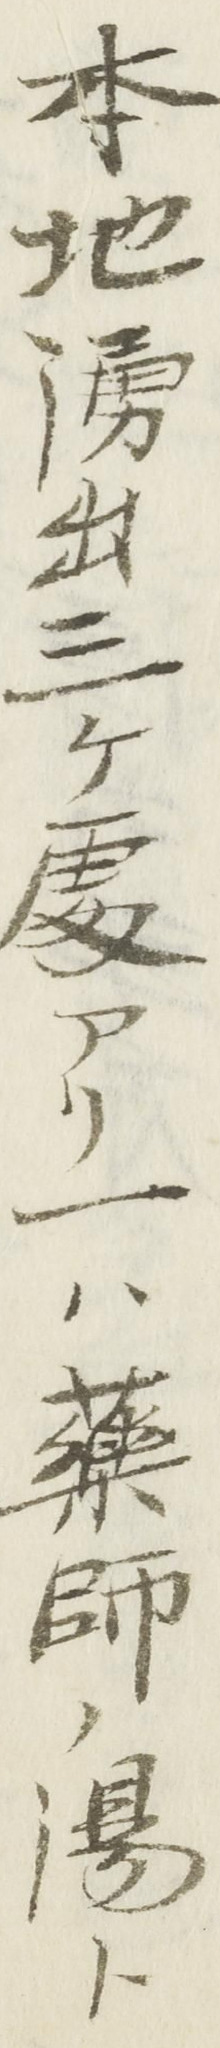本地湧出三ヶ処アリ一ハ薬師ノ湯ト
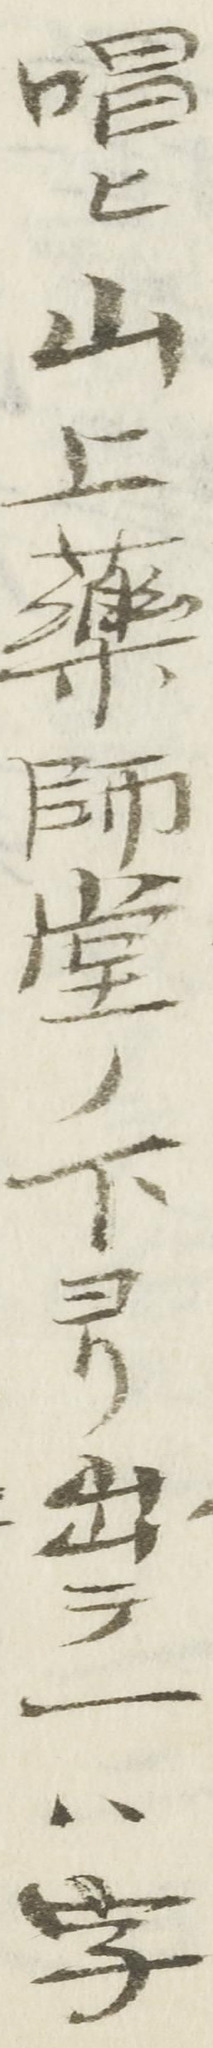唱ヒ山上薬師堂ノ下ヨリ出デ一ハ字
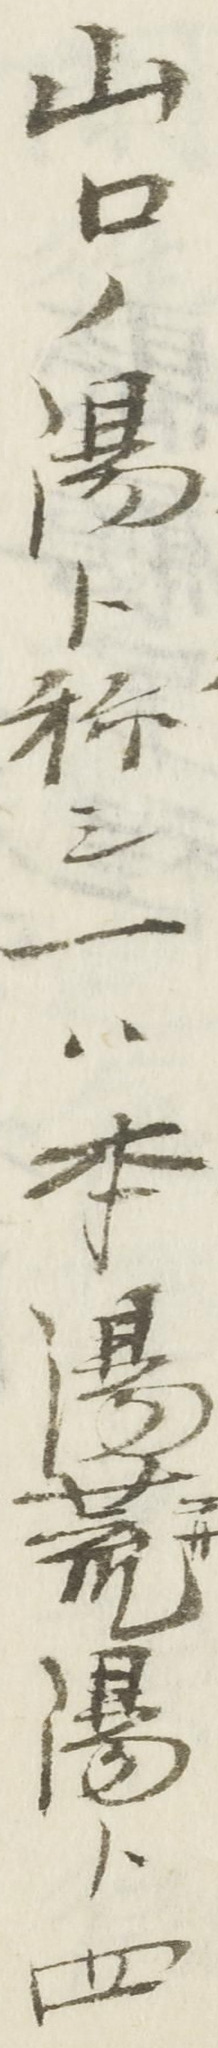山口ノ湯ト称シ一ハ本湯荒湯ト四
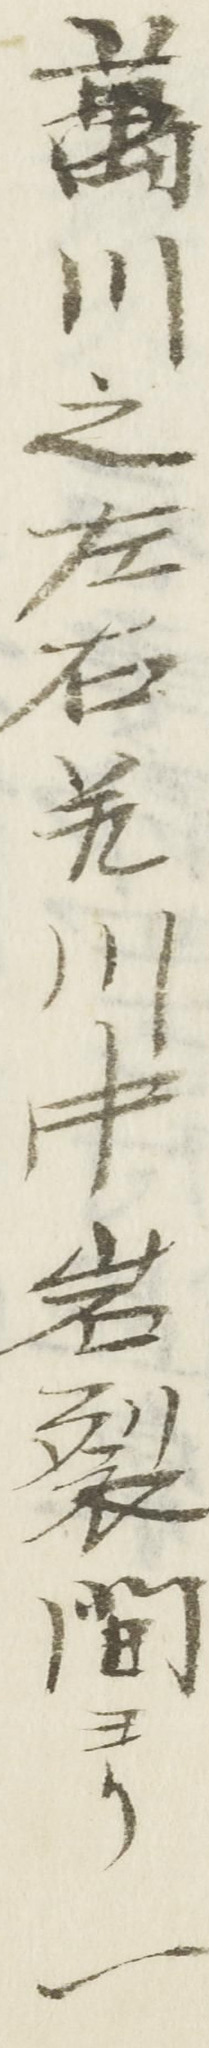万川之左右幷川中岩裂間ヨリ一
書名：温冷泉試験表
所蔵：東京大学地震研究所図書室 Earthquake Research Institute Library, The University of Tokyo, JAPAN
